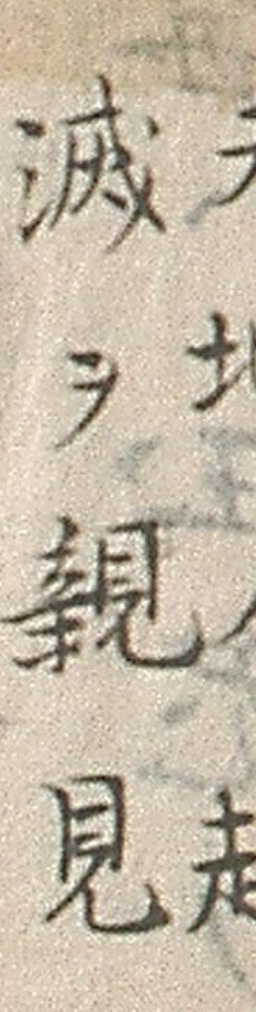滅ヲ親見
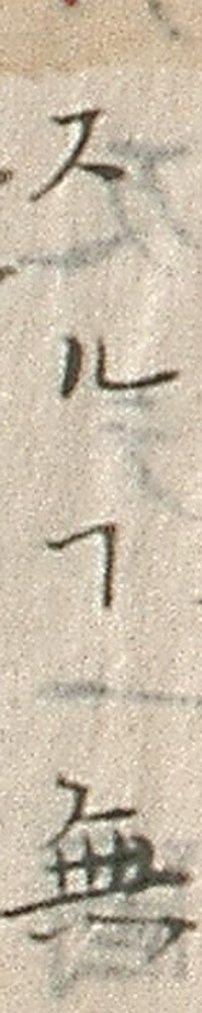スルコト無
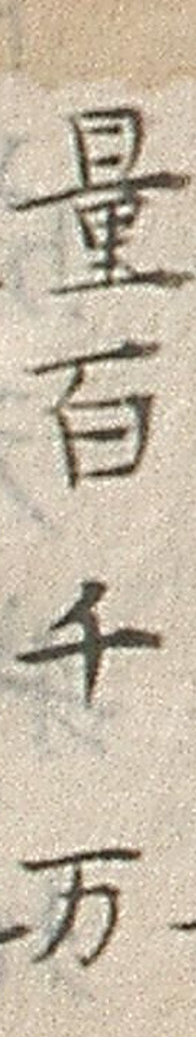量百千万
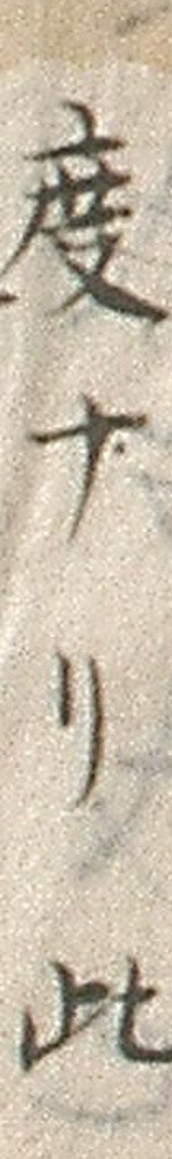度ナリ此
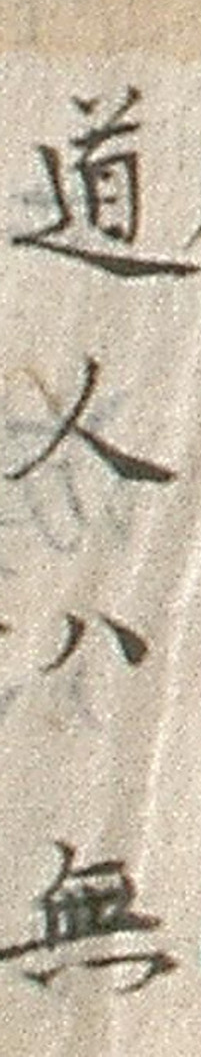道人ハ無
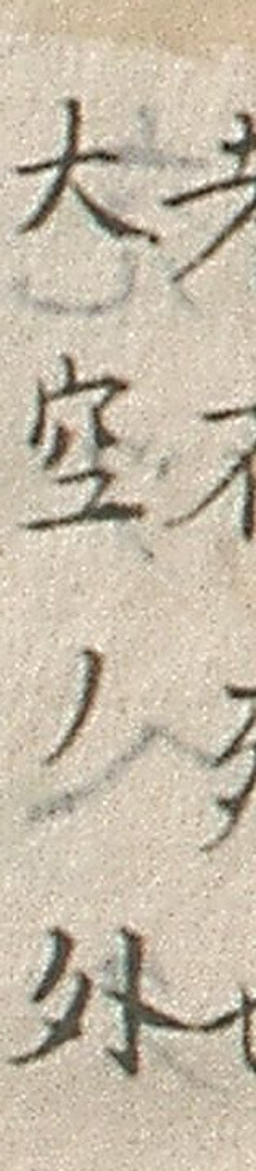大空ノ外
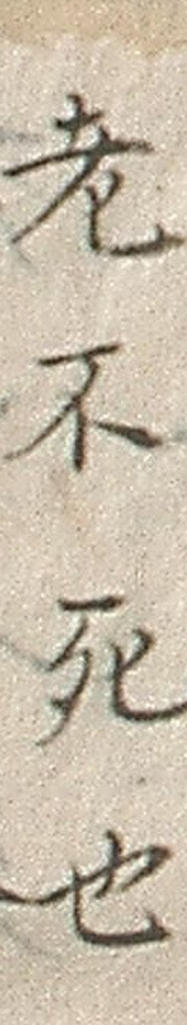老不死也
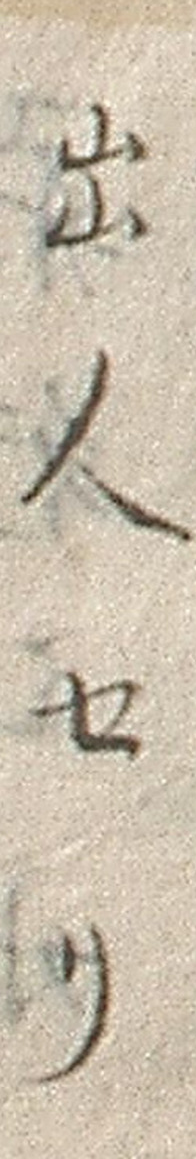出人セリ

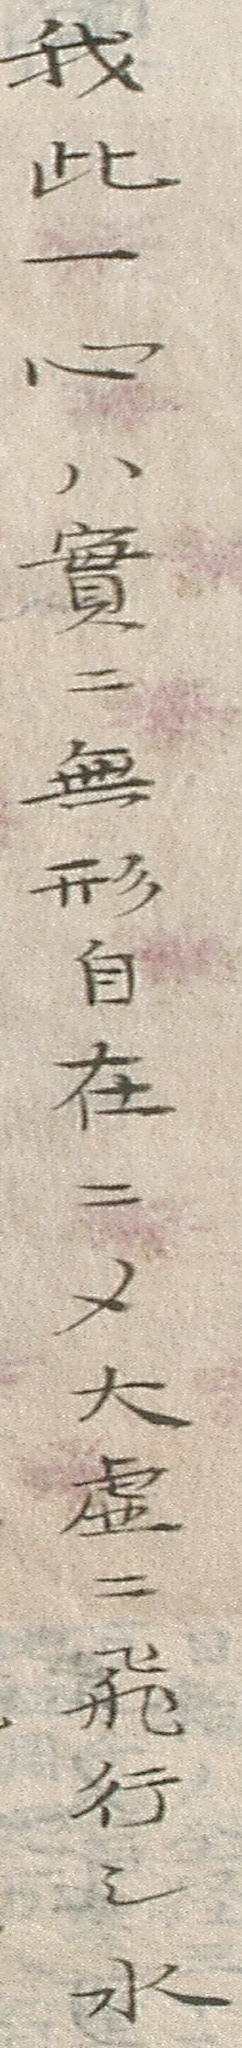我此一心ハ実ニ無形自在ニシテ大虚ニ飛行シ水
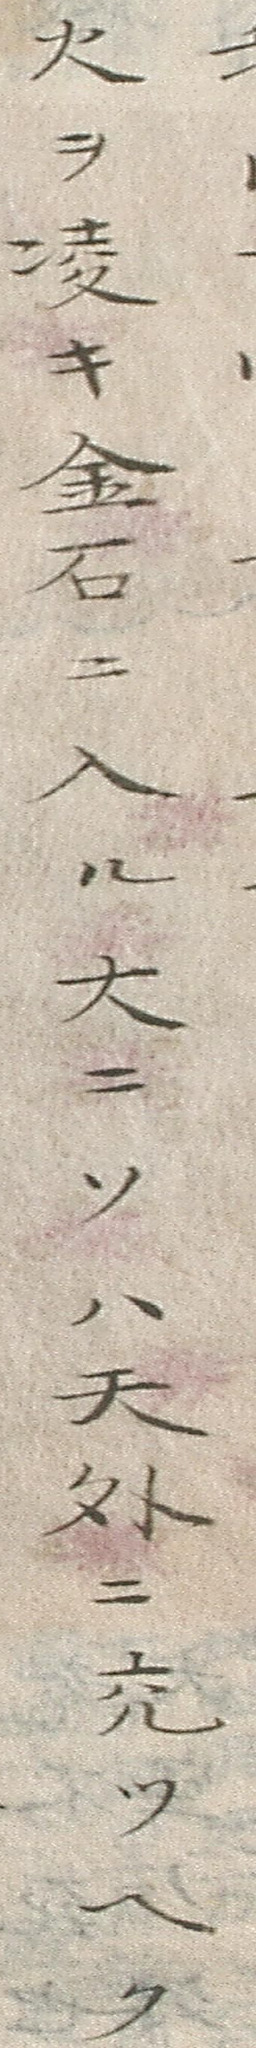火ヲ凌キ金石ニ入ル大ニシテハ天外ニ究ツヘク
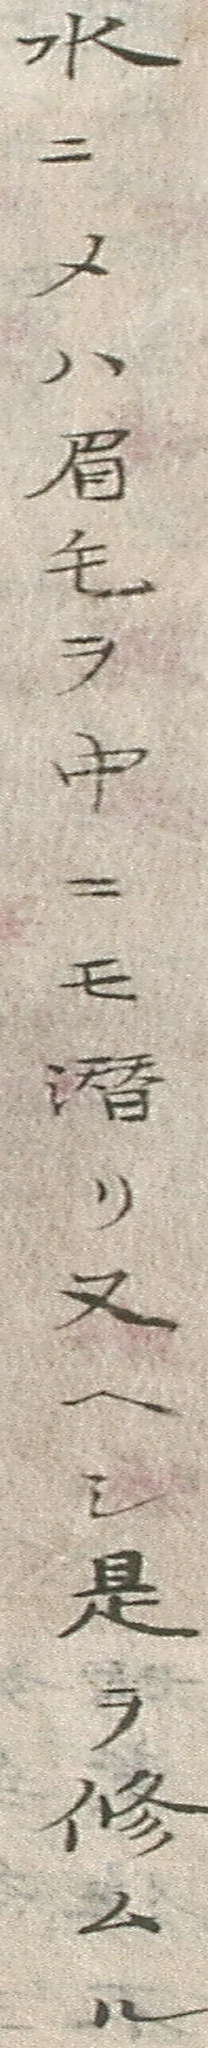水ニシテハ眉毛ヲ中ニモ潜リ又ヘシ是ヲ修ムル
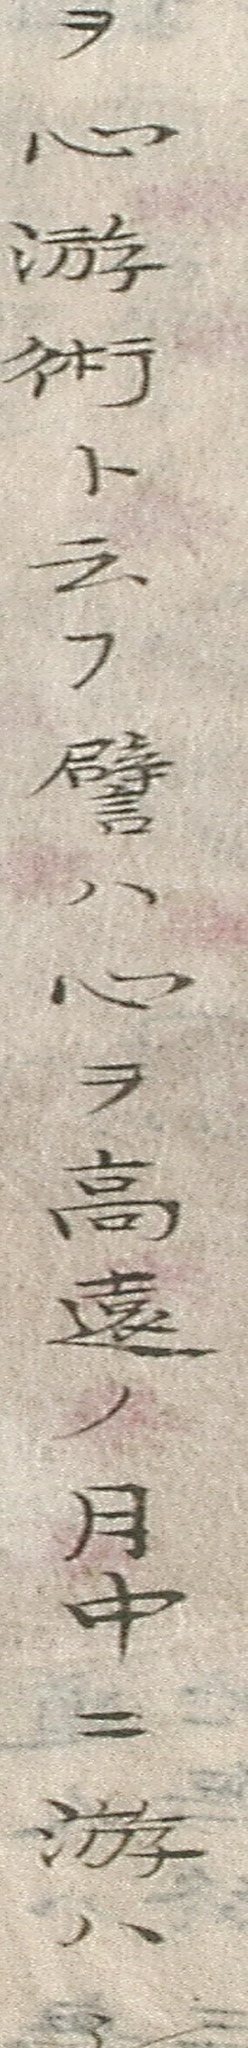ヲ心游術ト云フ譬ハ心ヲ高遠ノ月中ニ游ハシ
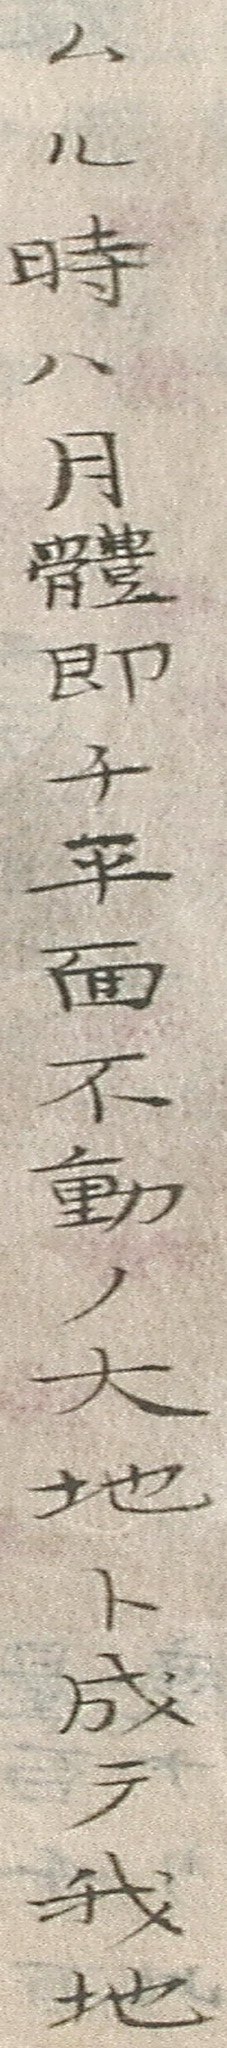ムル時ハ月体即チ平面不動ノ大地ト成テ我地
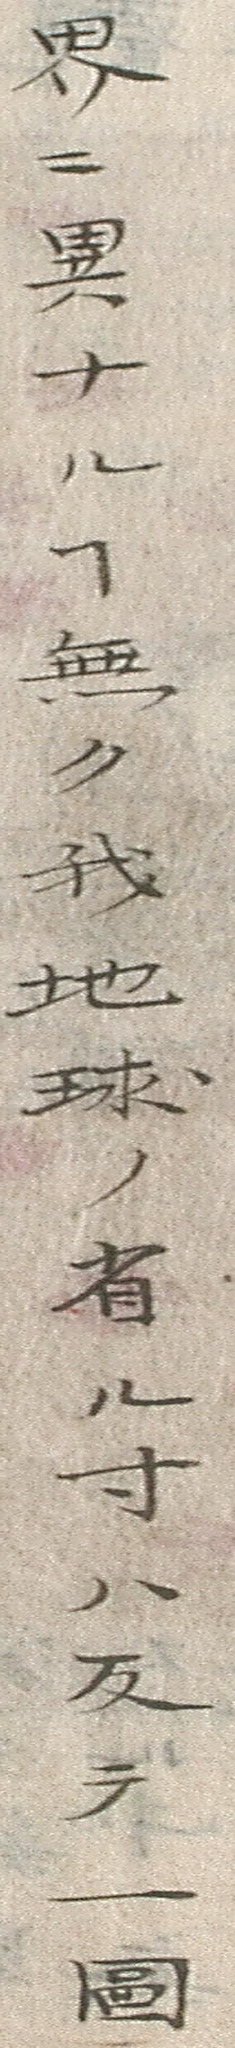界ニ異ナルコト無ク我地球ノ省ル寸ハ反テ一図
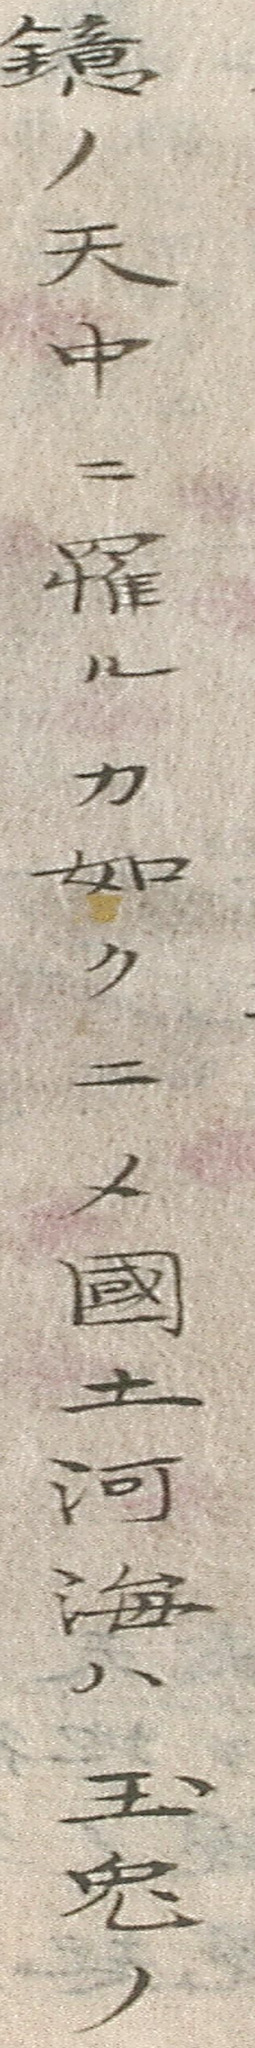鏡ノ天中ニ罹ルカ如クニシテ国土河海ハ玉兎ノ
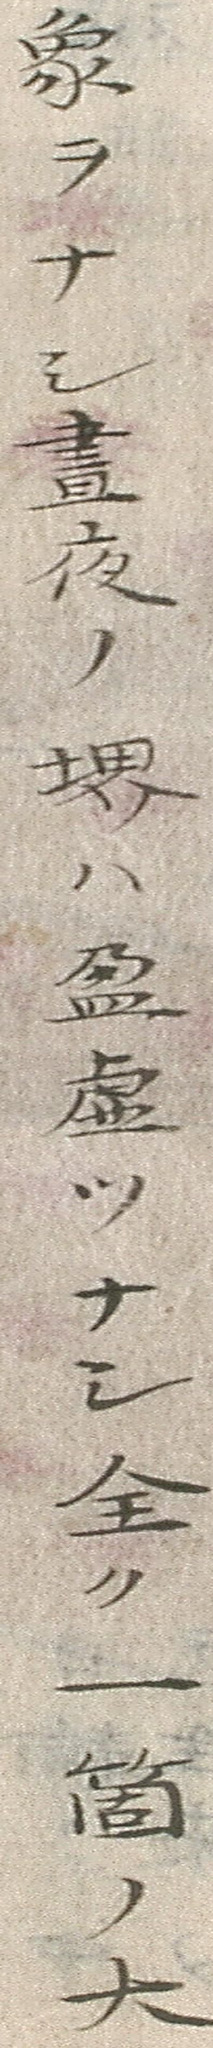象ヲナシ昼夜ノ堺ハ盈虚ツナシ全ク一箇ノ大
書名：天學略名目羽翼　全
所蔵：東京大学地震研究所図書室 Earthquake Research Institute Library, The University of Tokyo, JAPAN
